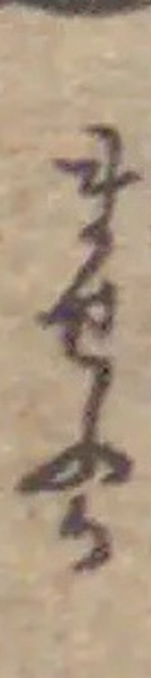ませふか

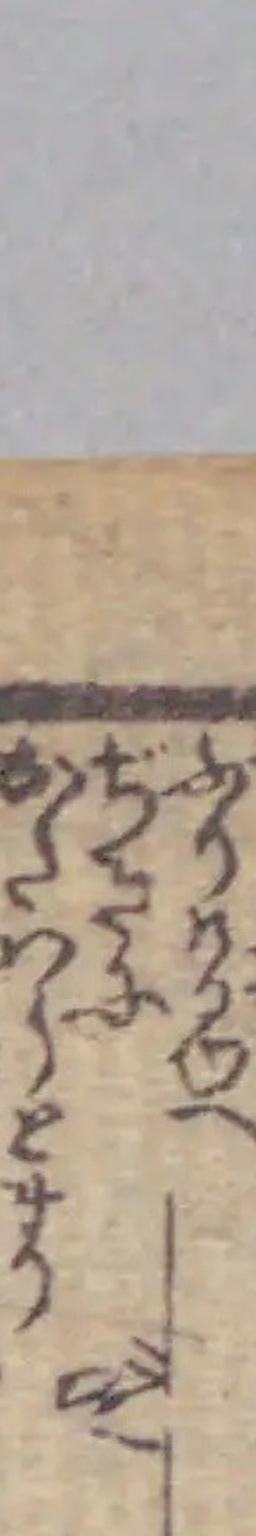ぢきに
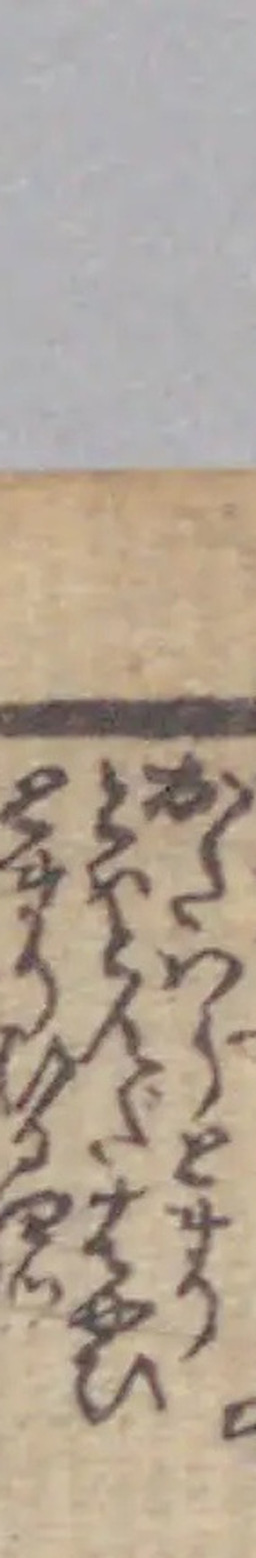とはとんだはやい
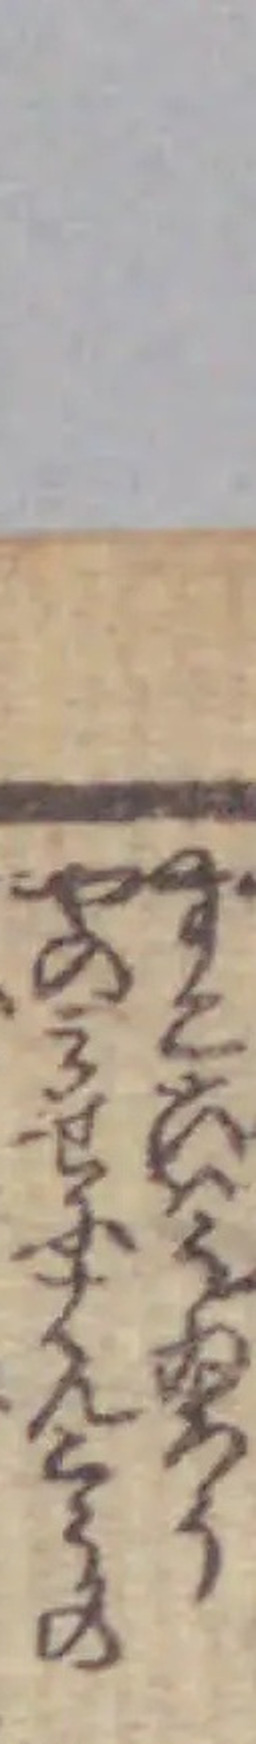やのみせにはんこうの
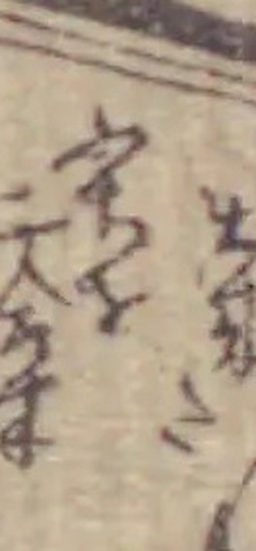ふちを
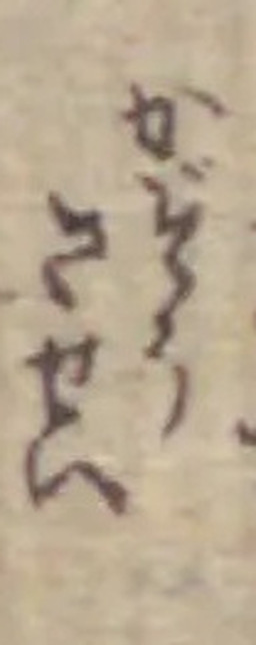させい
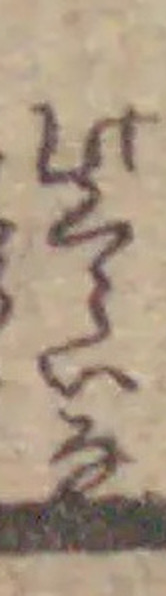此くらいな
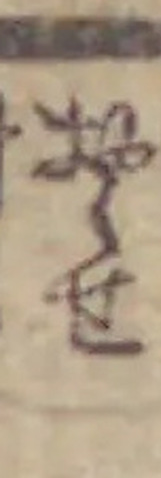おゝせ
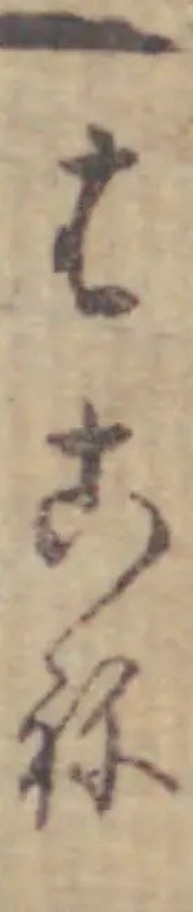はこね
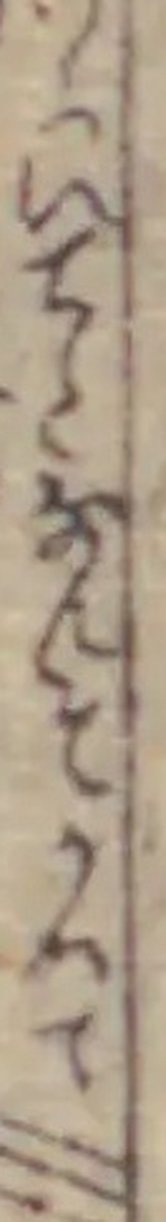いいちとなんぞかつて
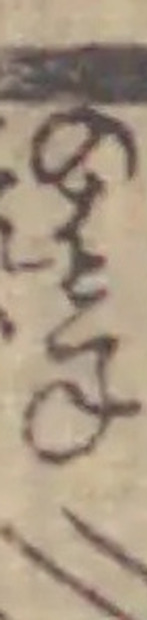のはこね
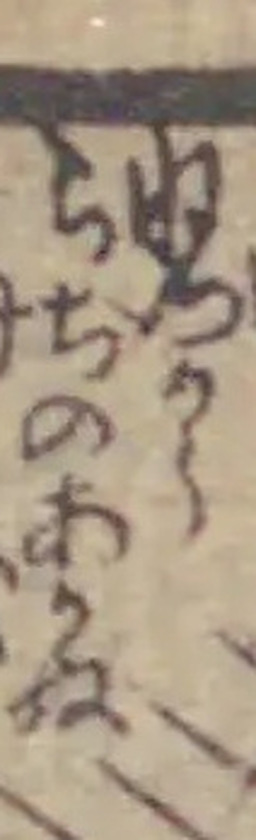らちのあかぬ
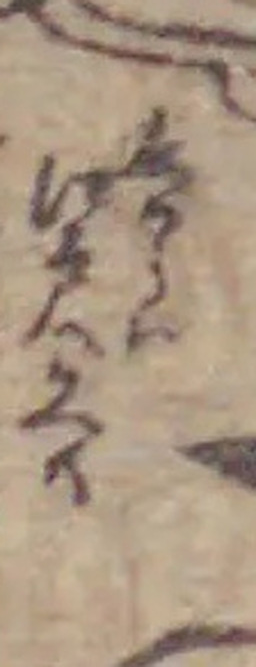江戸へかへり

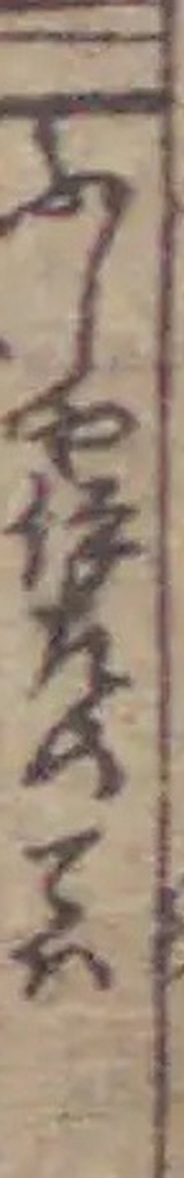ふしや伊左衛門ては
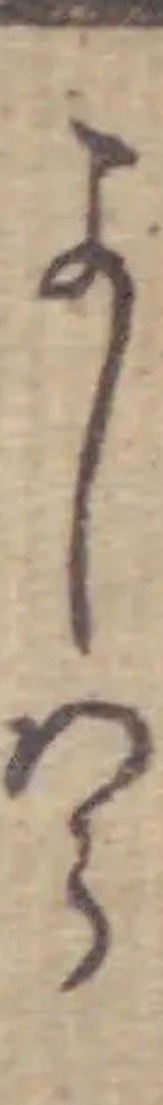よしはら
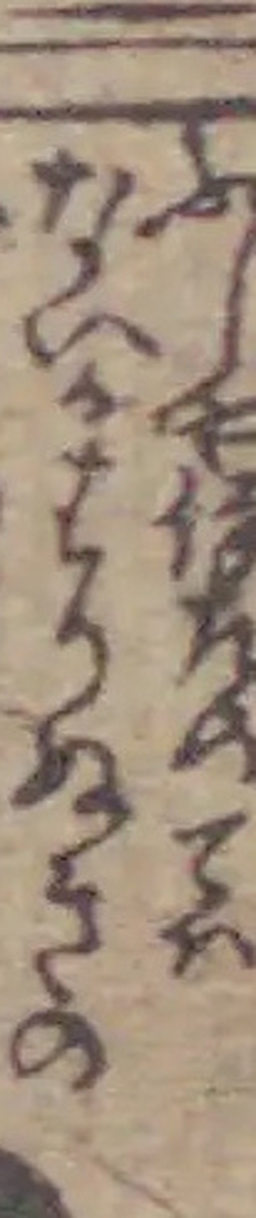ないかはりぬきの
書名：道笑双六
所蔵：国立国会図書館 National Diet Library, JAPAN
